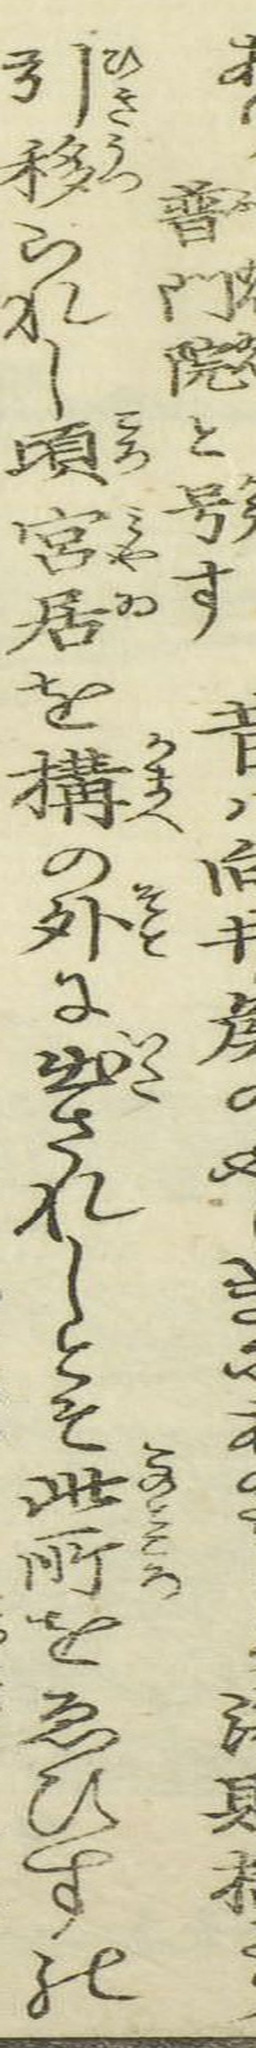引移られし頃宮居を構の外に出されしとそ此所をゑひすの
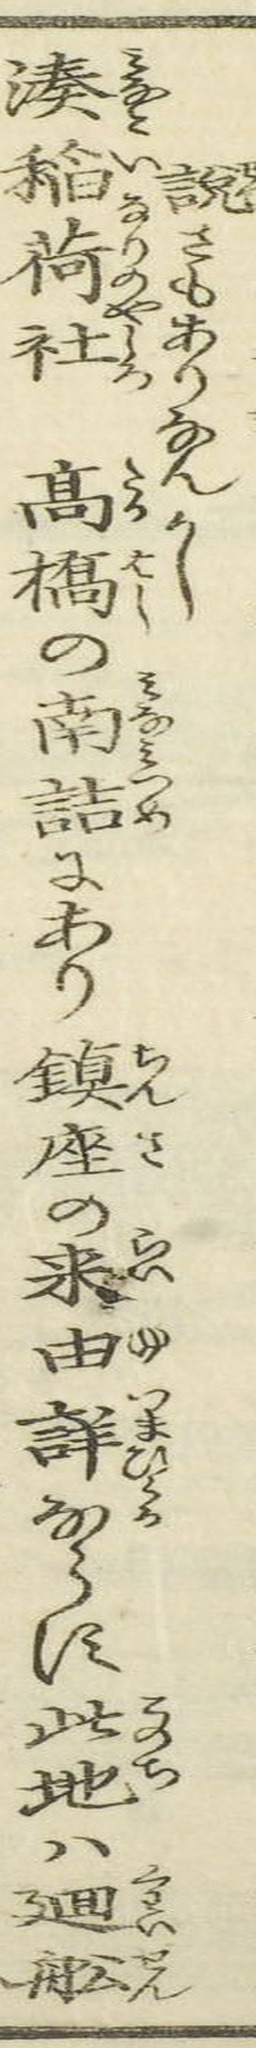湊稲荷社高橋の南詰にあり鎮座の来由詳ならす此地は廻船
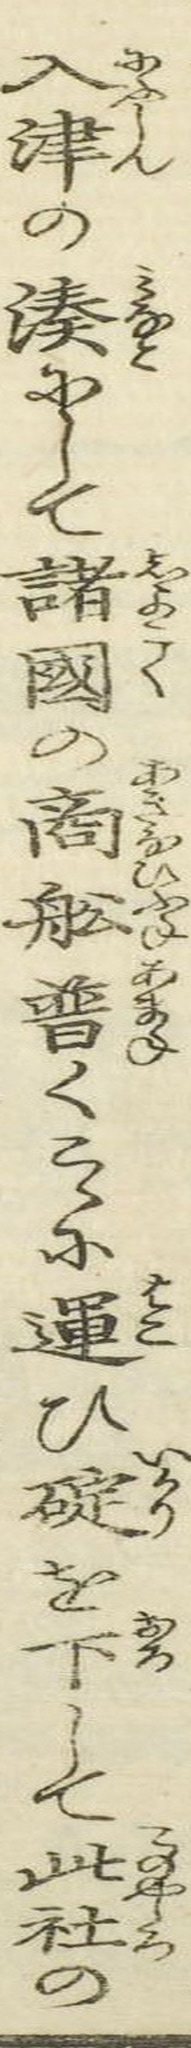入津の湊にして諸国の商舩普くこゝに運ひ碇を下して此社の
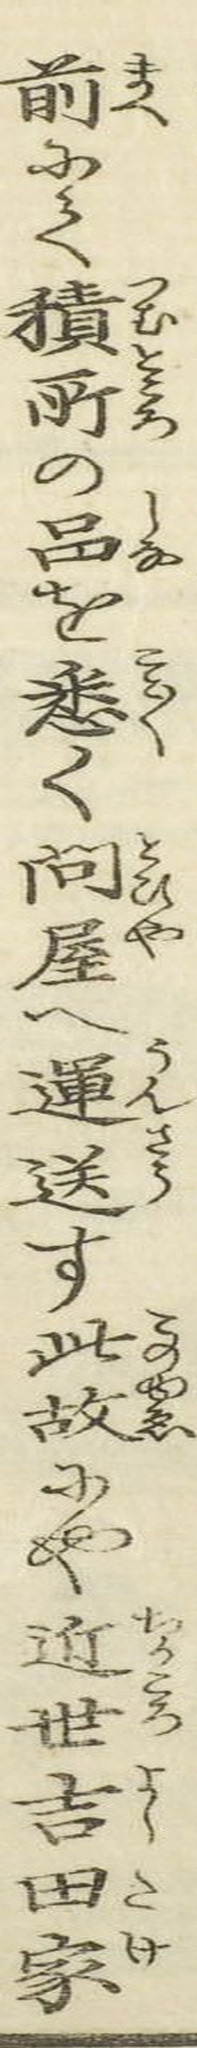前にて積所の品を悉く問屋へ運送す此故にや近世吉田家
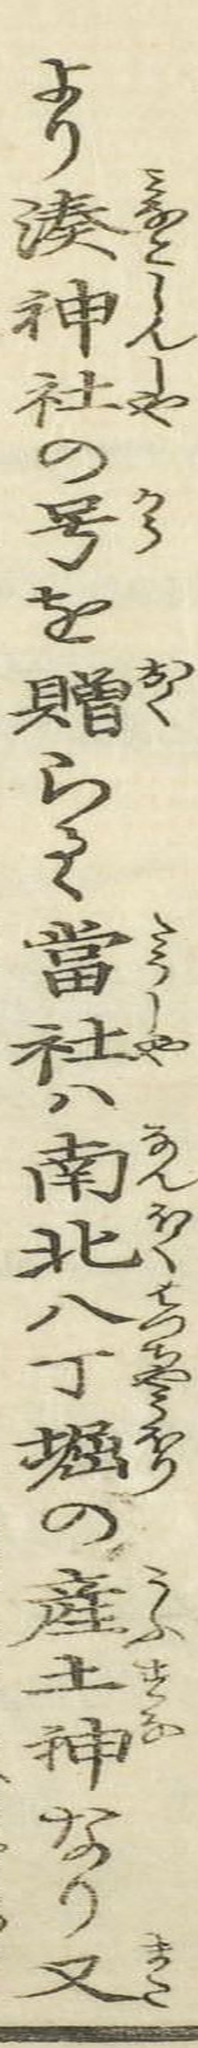より湊神社の号を贈らるゝ當社は南北八丁堀の産土神なり又
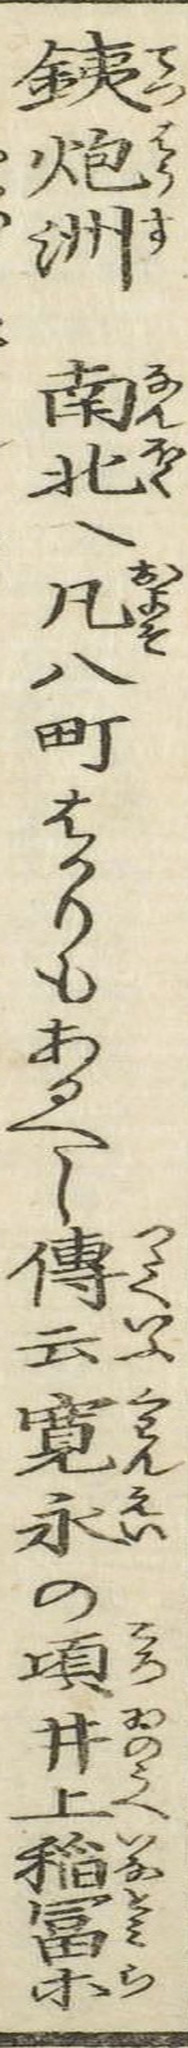鉄炮洲南北へ凡八町はかりもあるへし傳云寛永の頃井上稲冨等
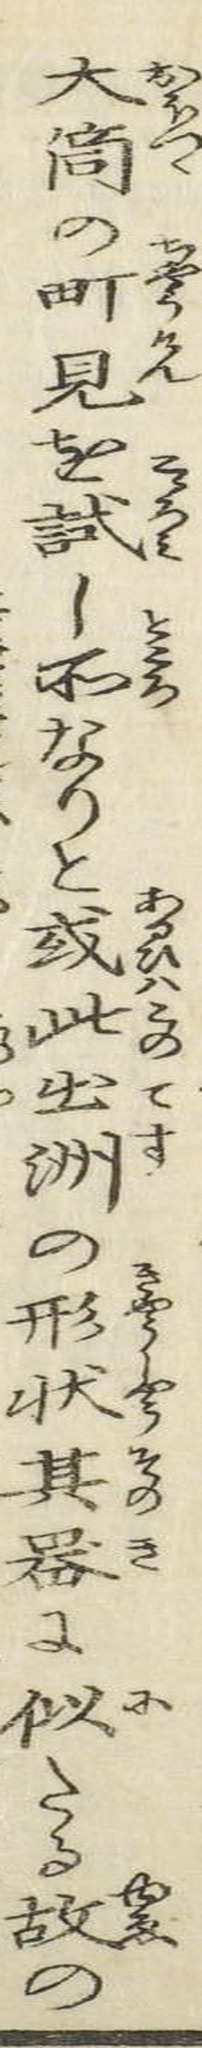大筒の町見を試し所なりと或此出洲の形状其器に似たる故の
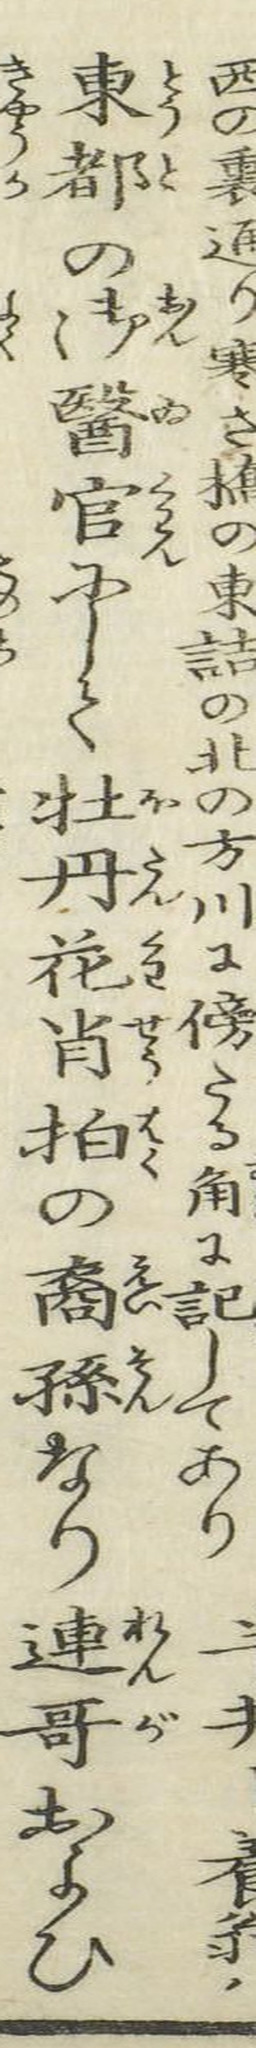東都の御醫官にして牡丹花肖柏の裔孫なり連哥およひ
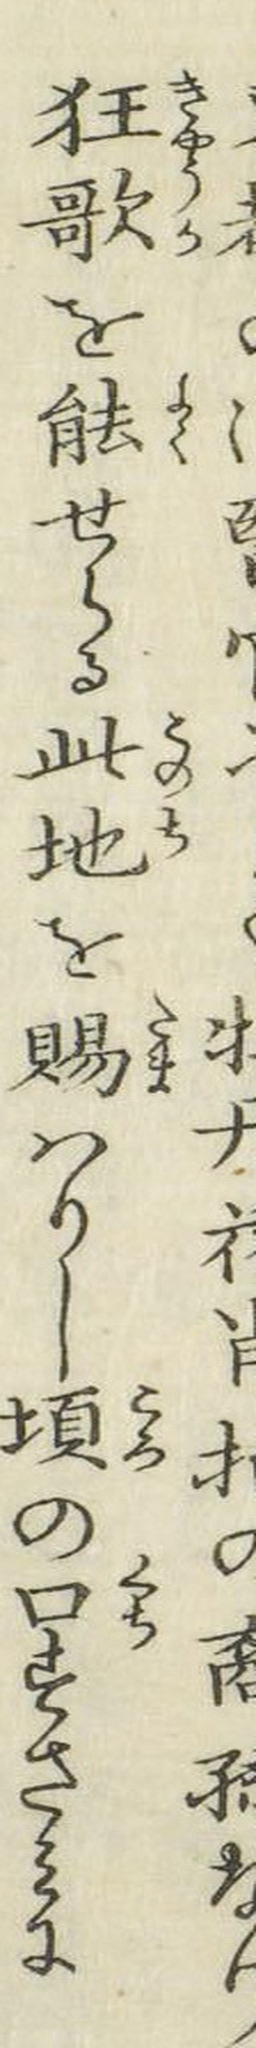狂歌を能せらる此地を賜はりし頃の口すさみに
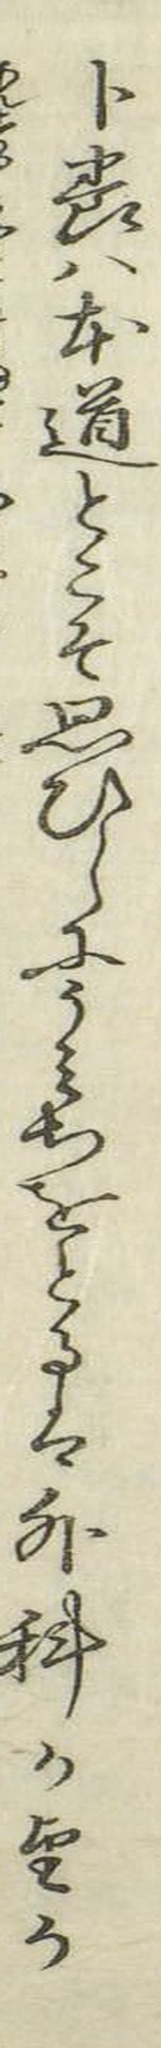卜養は本道とこそ思ひしにうみちをとるは外科か望か
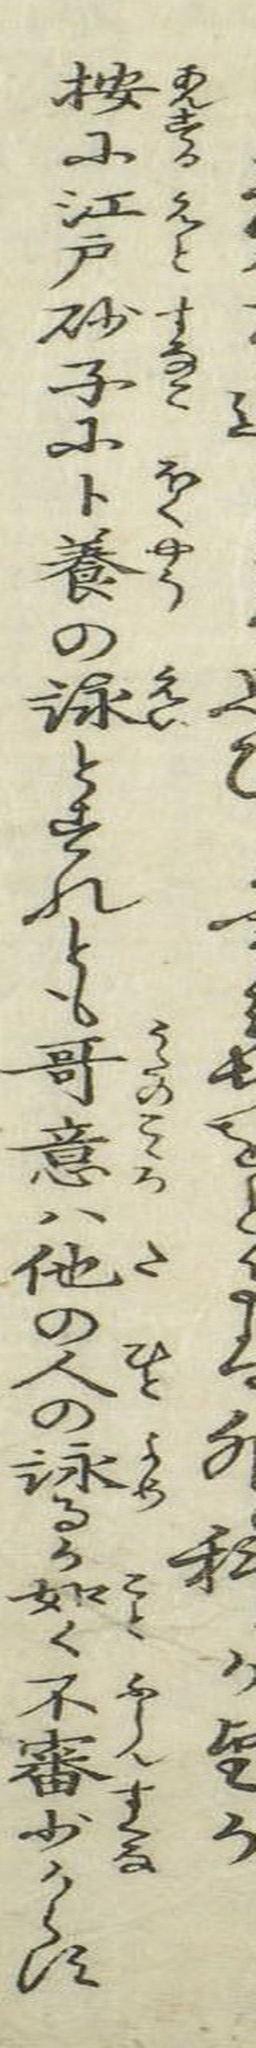按に江戸砂子に卜養の詠とすれとも哥意は他の人の詠るか如く不審少からす
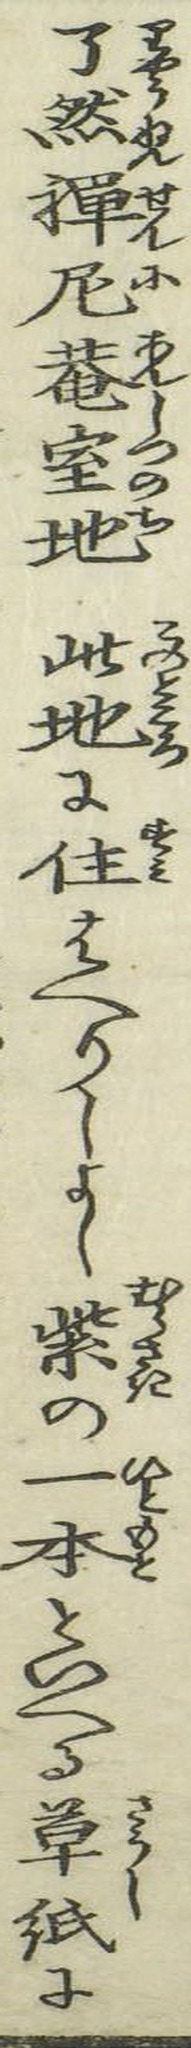了然禅尼庵室地此地に住はへりしよし紫の一本といへる草紙に
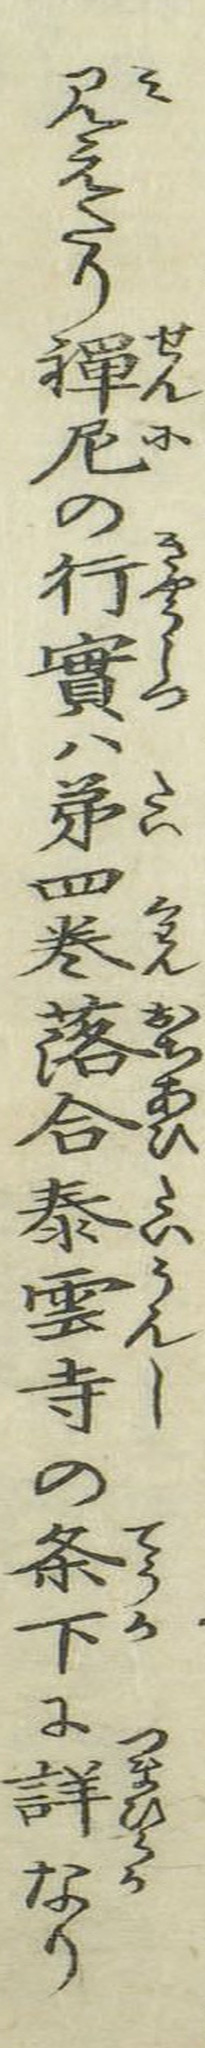見えたり禅尼の行實は第四巻落合泰雲寺の条下に詳なり

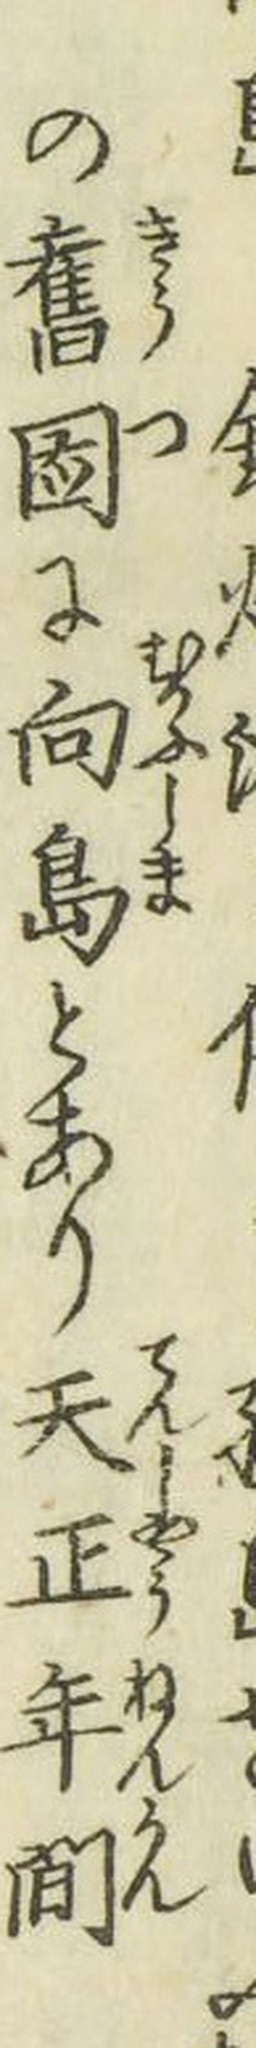の舊図に向島とあり天正年間
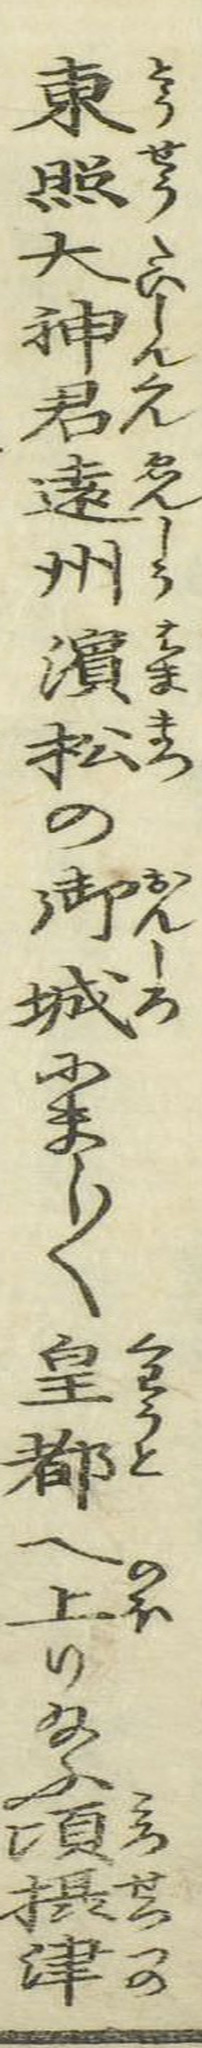東照大神君遠州濱松の御城にまし〳〵皇都へ上り給ふ頃摂津
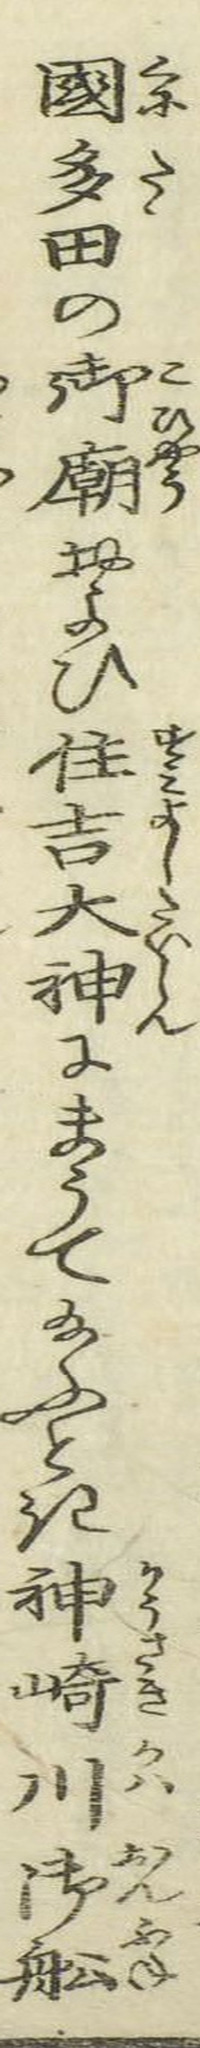國多田の御廟およひ住吉大神にまうて給ふとき神崎川御舩
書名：江戸名所図会 20巻 巻之2
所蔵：東京学芸大学教育コンテンツアーカイブ
